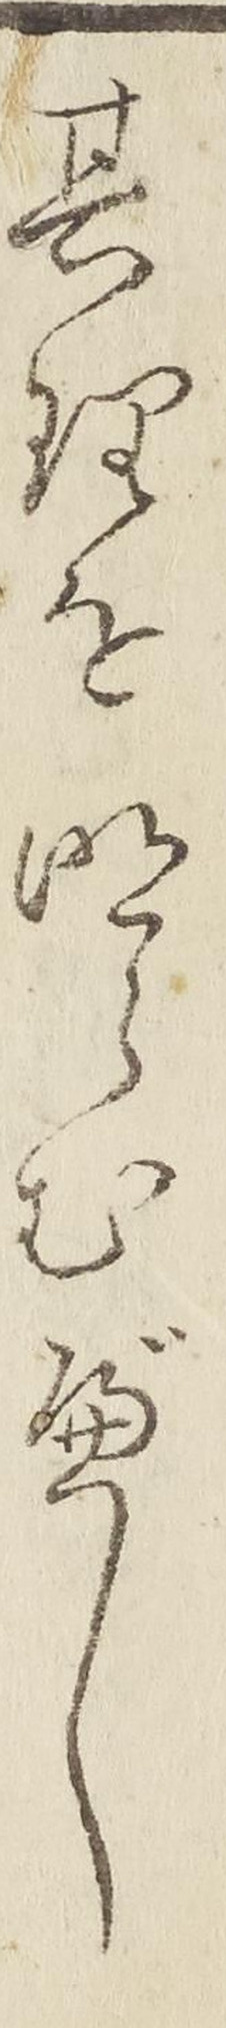其理を明らむべし
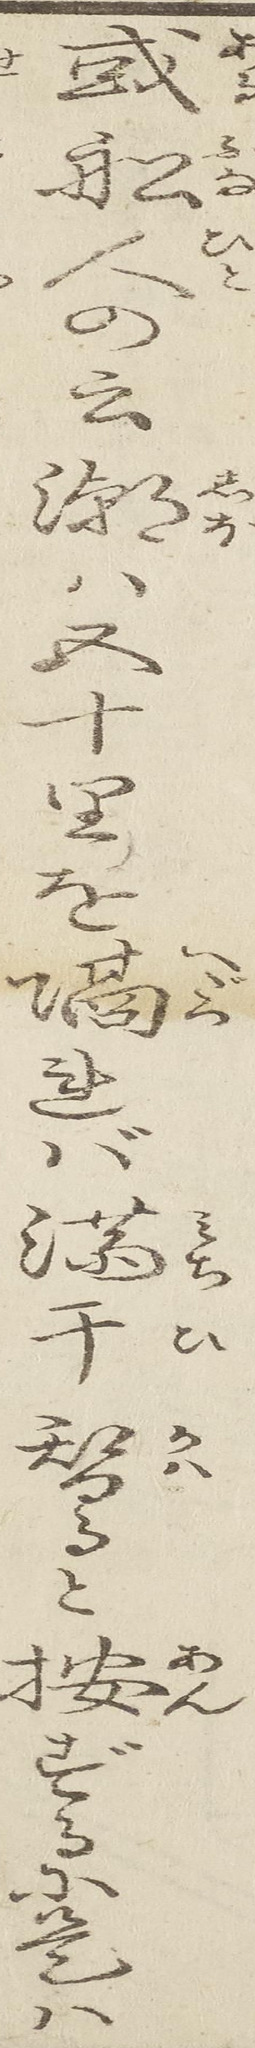或船人の云潮は五十里を隔れば満干替ると按ずるに是は
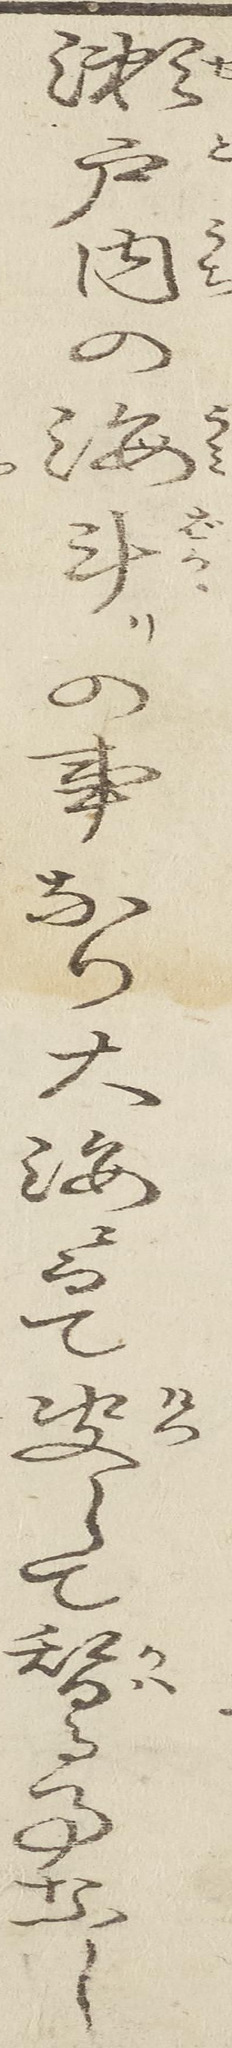瀬戸内の海計りの事なり大海ニ而て決して替る事なし
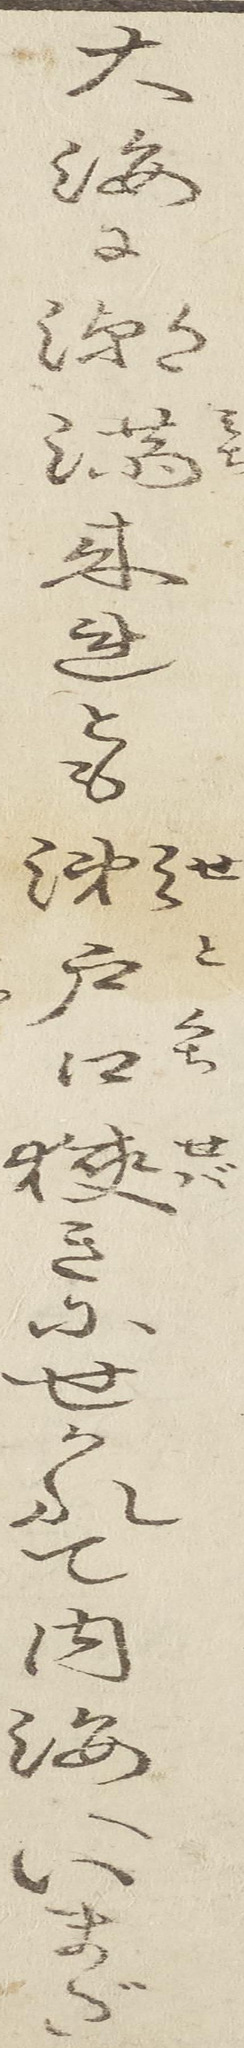大海に潮満来れとも瀬戸口狭きにせかれて内海へいまだ
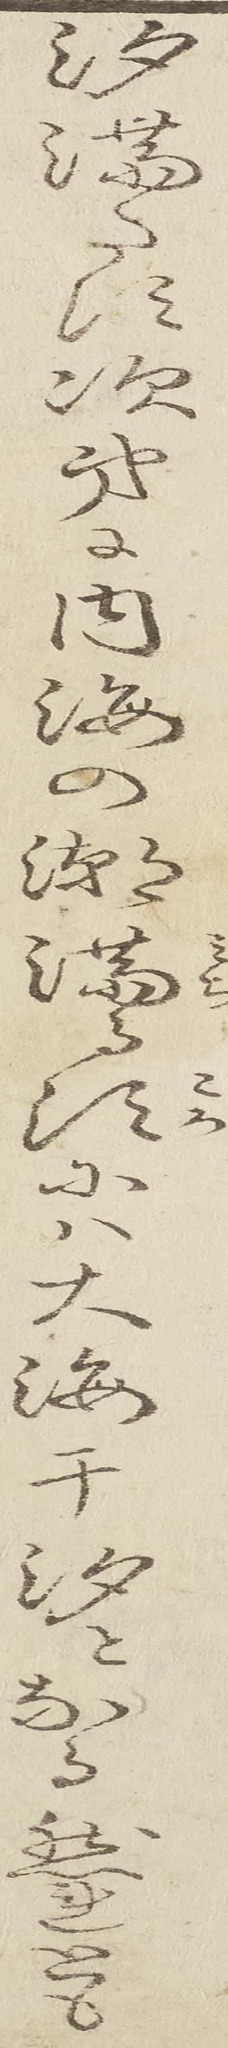汐満たす次第に内海の潮満る頃には大海干汐となる然れとも
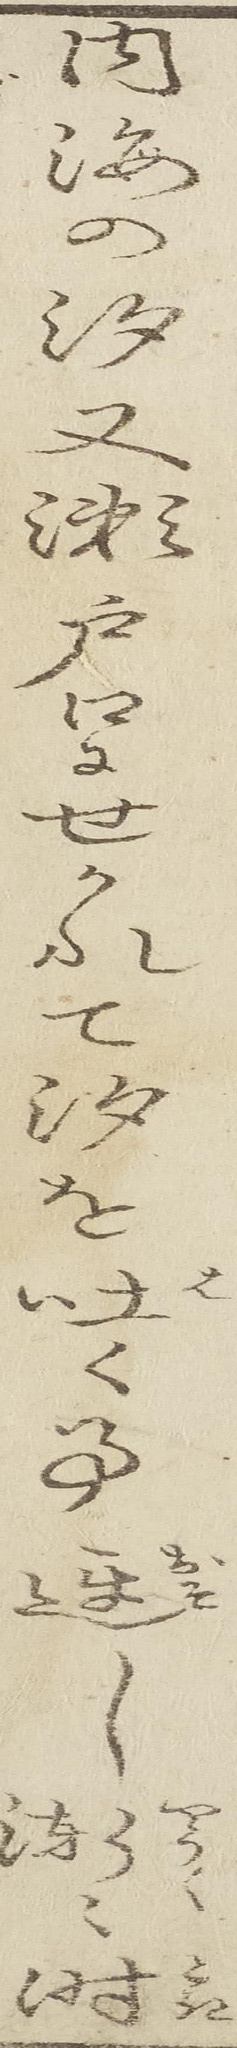内海の汐又瀬戸口にせかれて汐を吐く事遅し漸々時
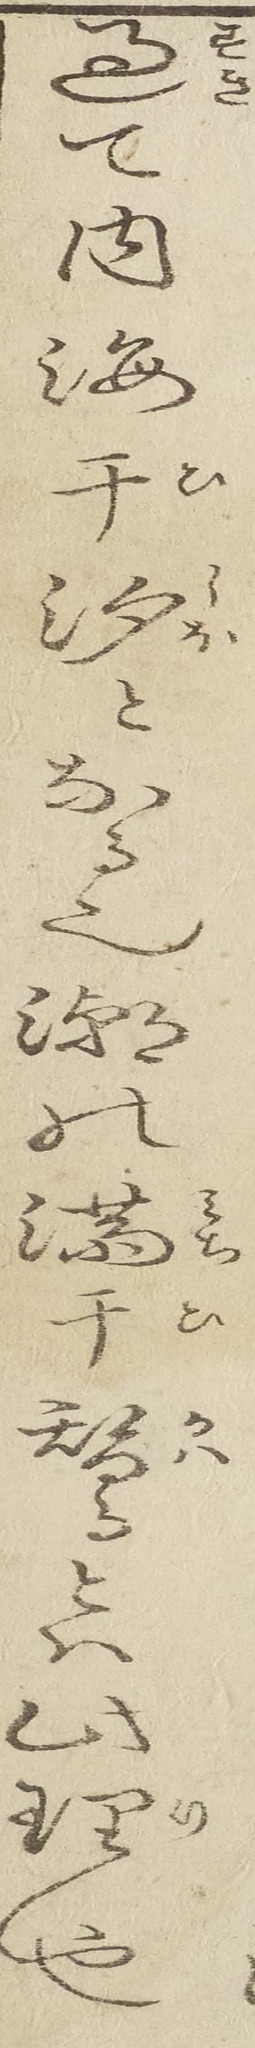過て内海干汐となる也潮の満干替るとは此理也

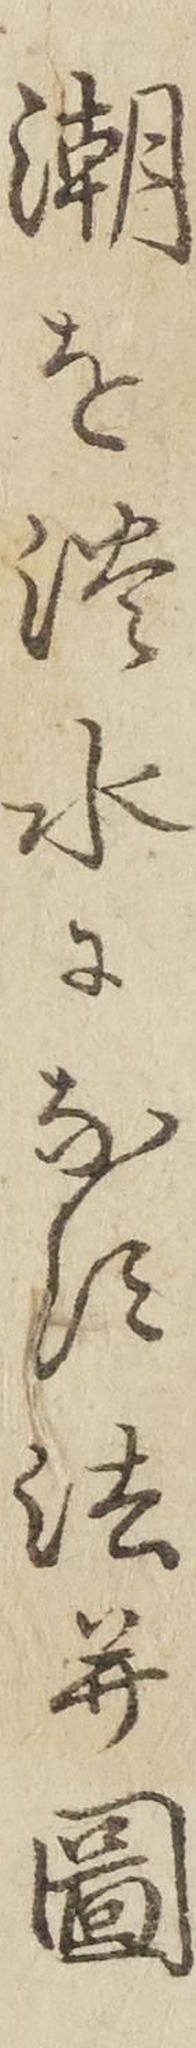潮を淡水になす法幷図
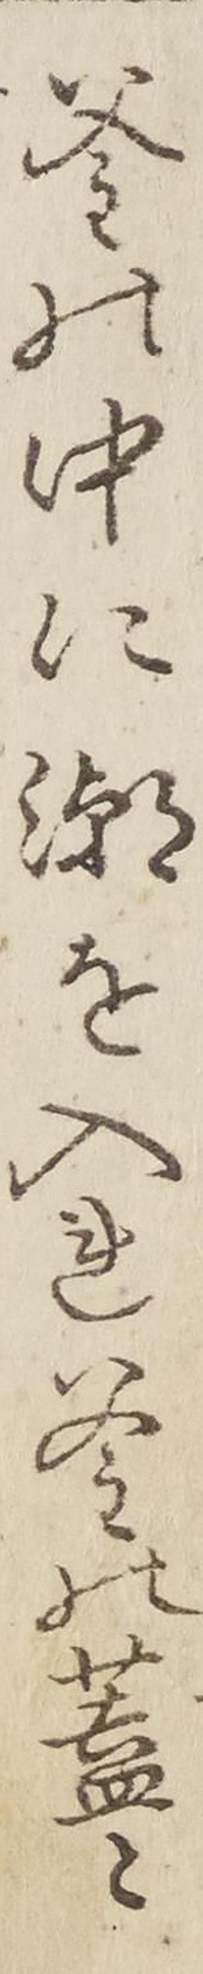釜の中に潮を入れ釜の蓋ニ
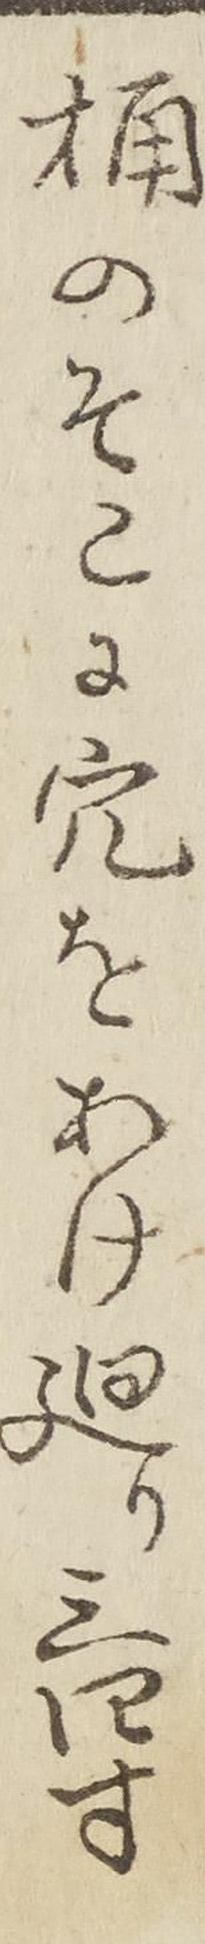桶のそこに穴をあけ廻り三四寸
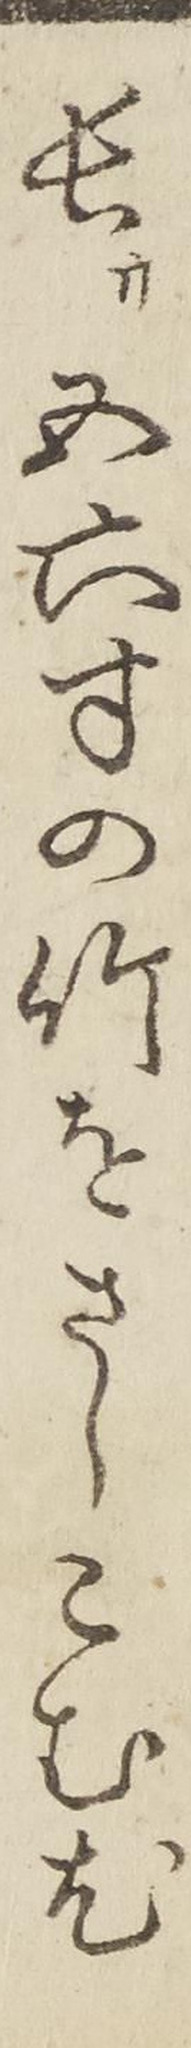長サ五六寸の竹をさしこむ尤
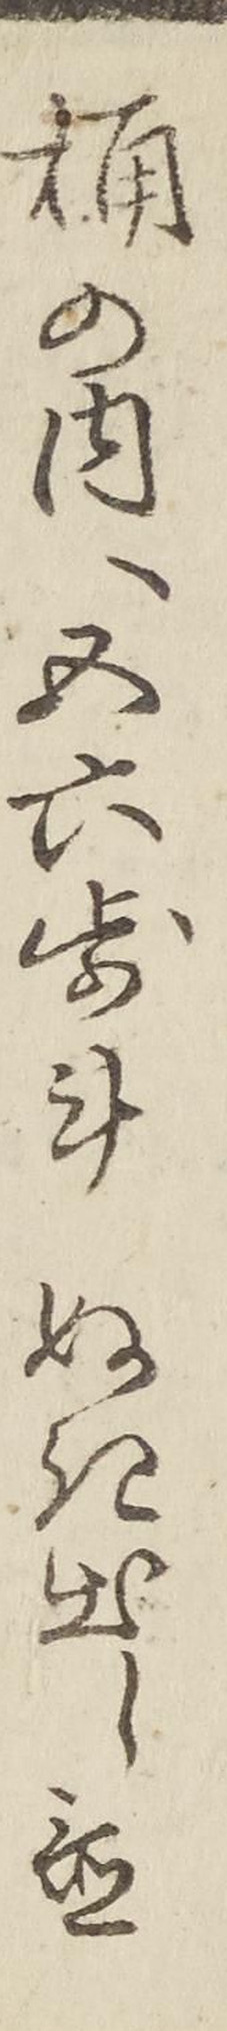桶の内へ五六歩計ぬき出し置
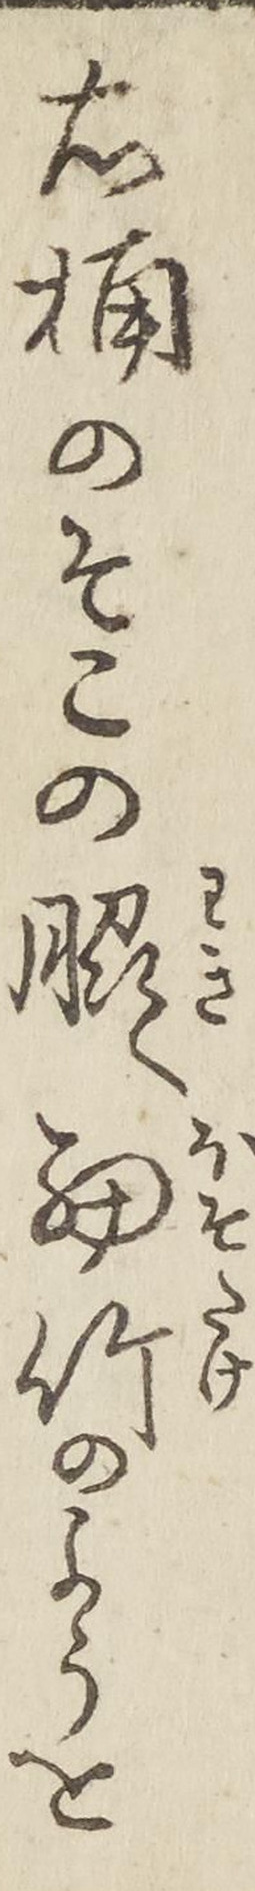右桶のそこの脇へ細竹のようを
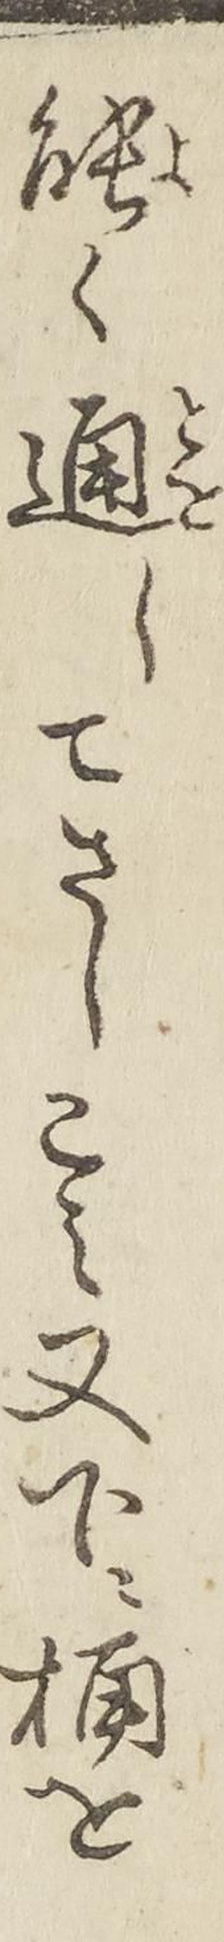能く通してさしこみ又下ニ桶を
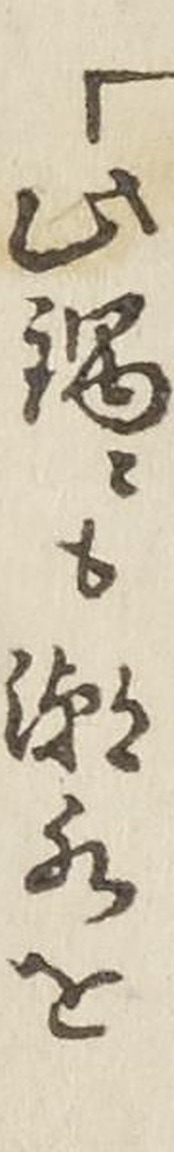此鍋ニも潮水を
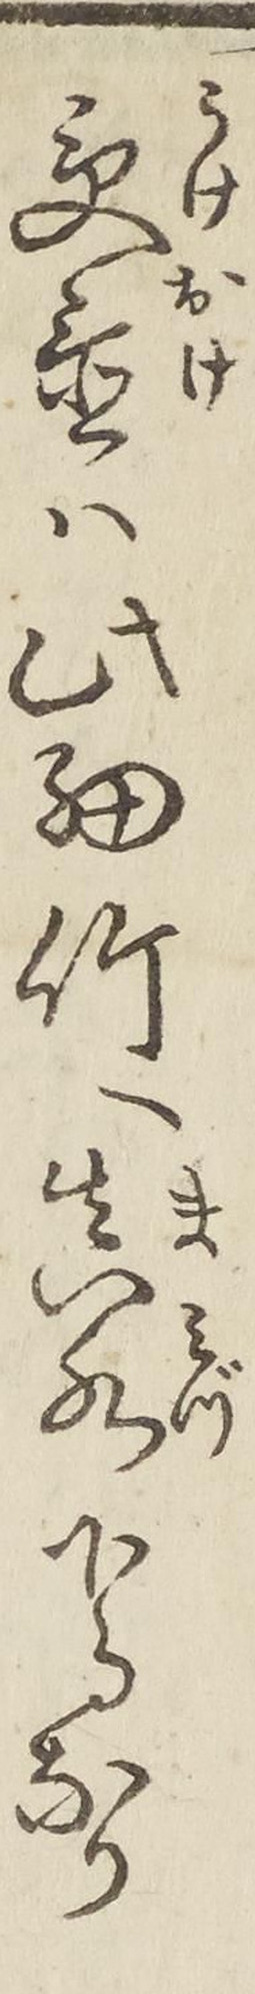受置は此細竹へ真水下るなり
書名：平天儀圖解
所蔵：東京大学地震研究所図書室 Earthquake Research Institute Library, The University of Tokyo, JAPAN
